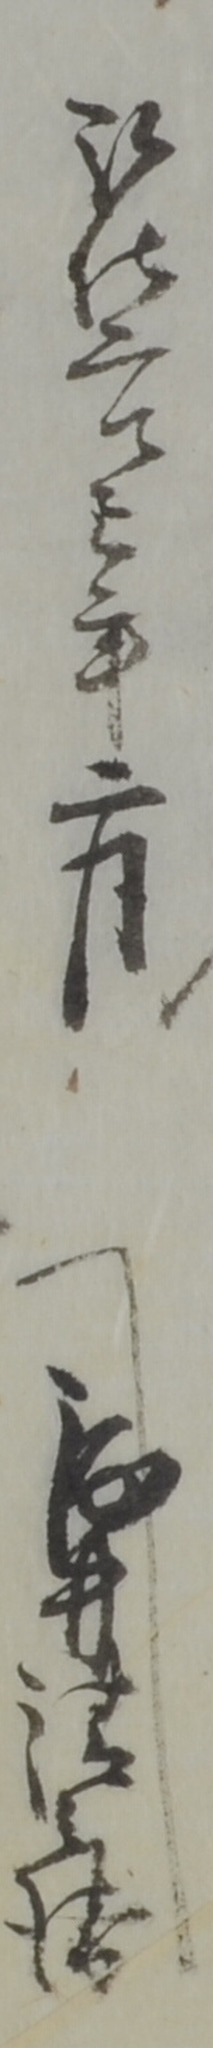弘化二乙巳年二月酒井清兵衛
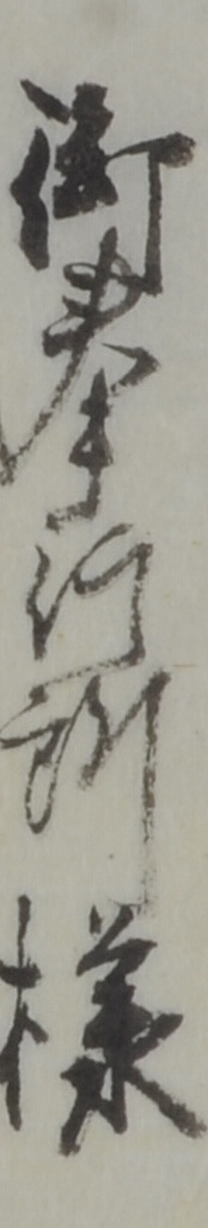御奉行所様
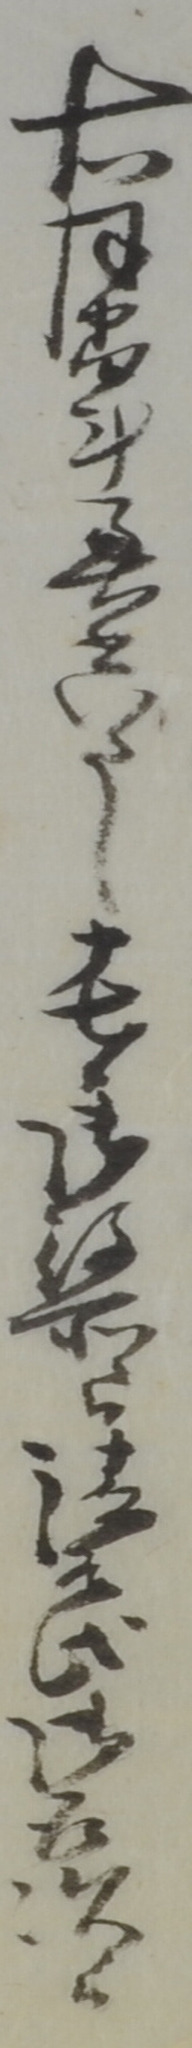右月番計奥書いたし十七日御役所ニ而清水氏御取次ニ而
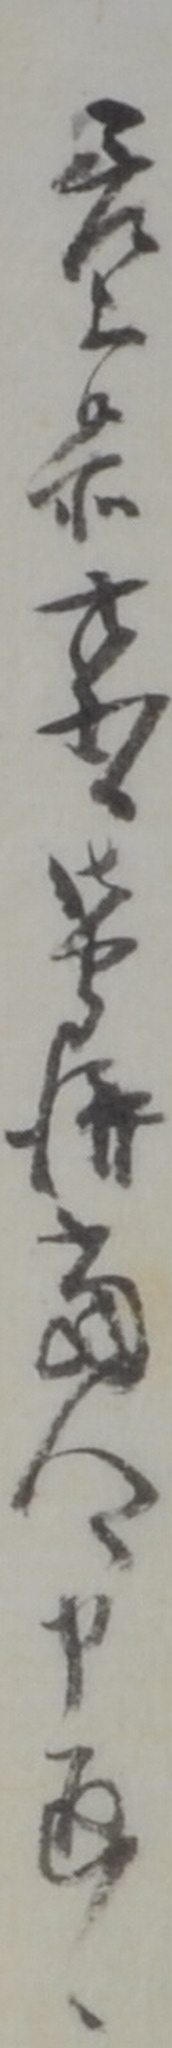差上候所廿五日御聞済当人へ申通候
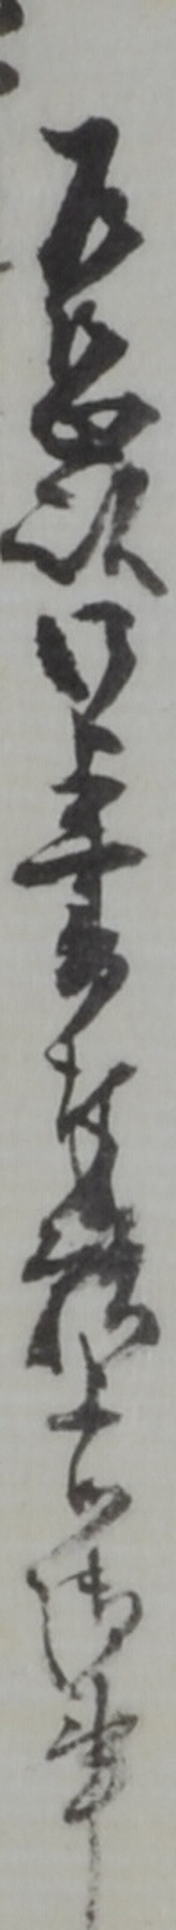乍恐以口上書奉願上候御事
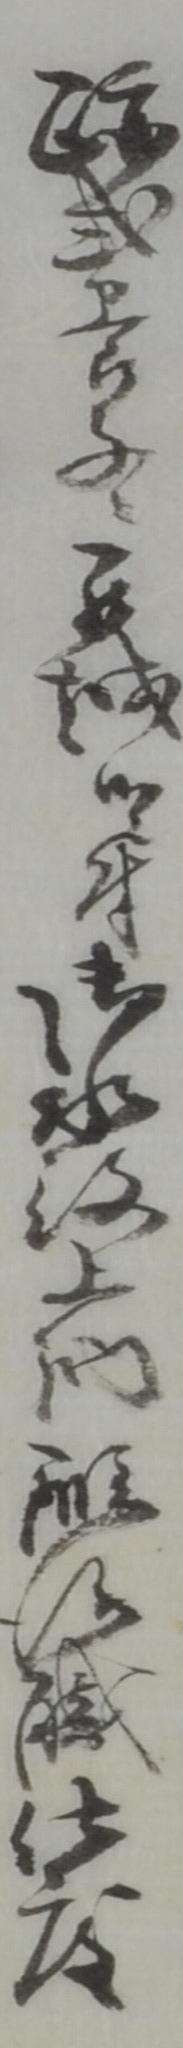跡式養子ニ罷越候ニ付御水役上納鍛冶職仕度
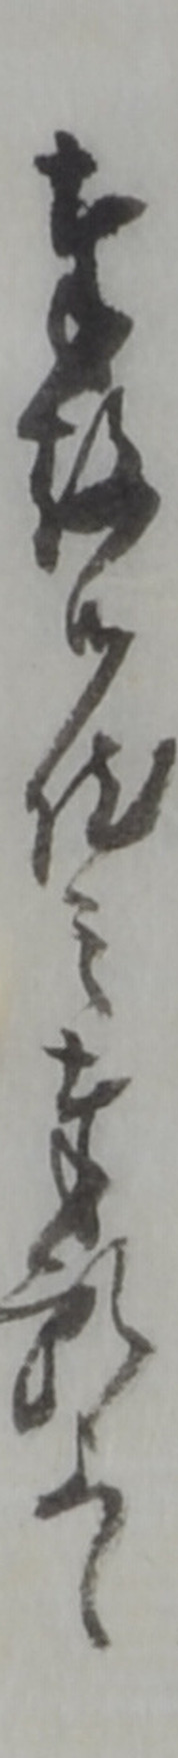奉存候依之奉願上候
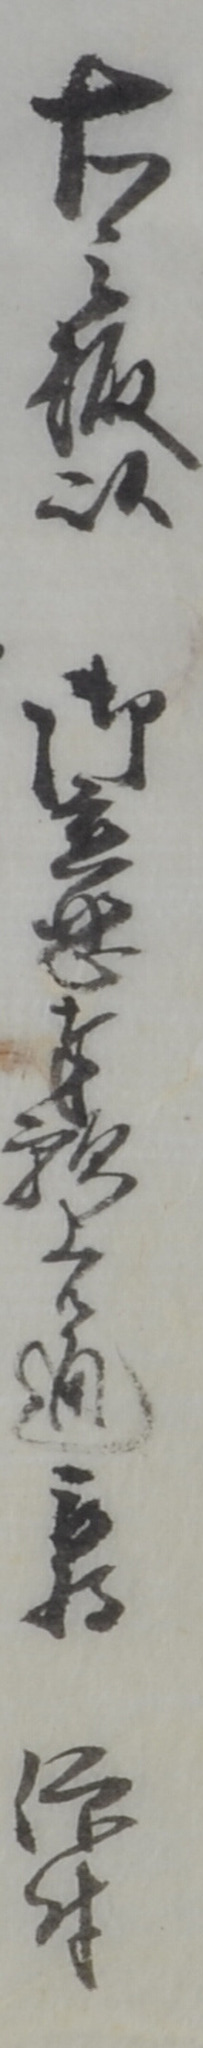右之趣以御慈悲奉願上候通被為仰付
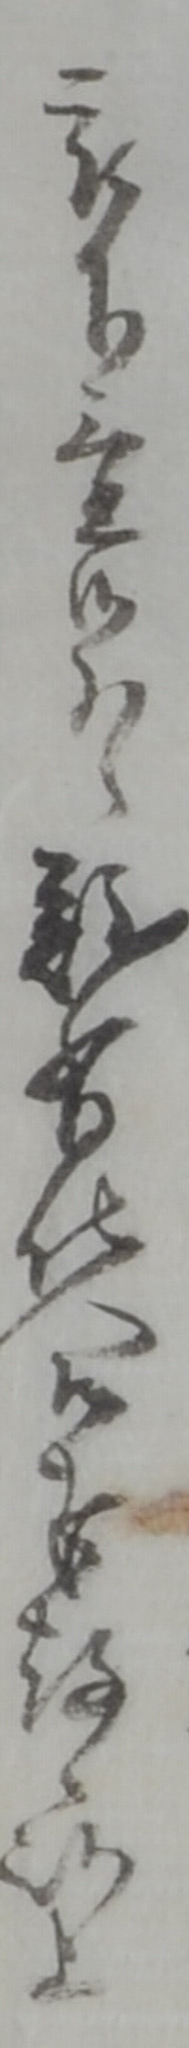被下置候ハヽ難有仕合奉存候以上
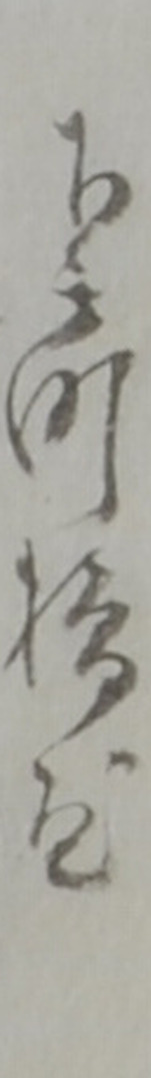下モ町橋屋
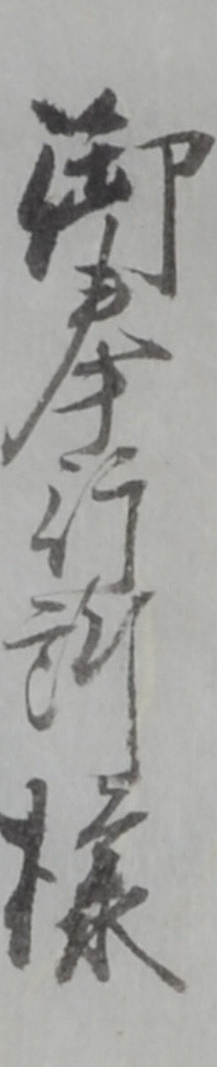御奉行所様

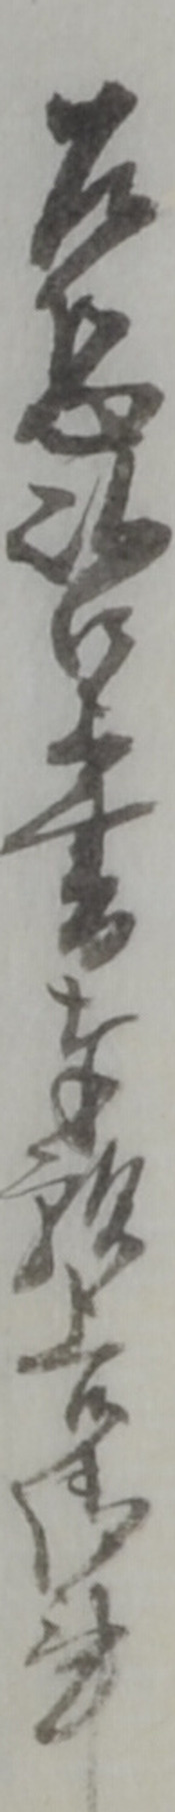乍恐以口上書奉願上候御事
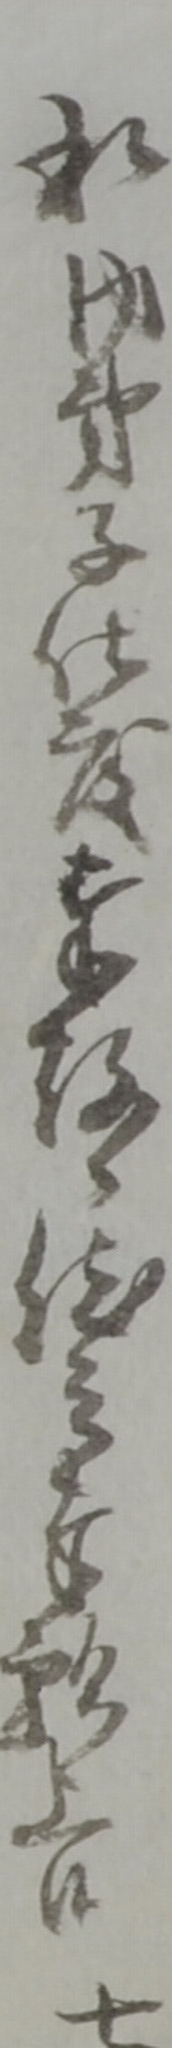私内弟子仕度奉存候依之奉願上候
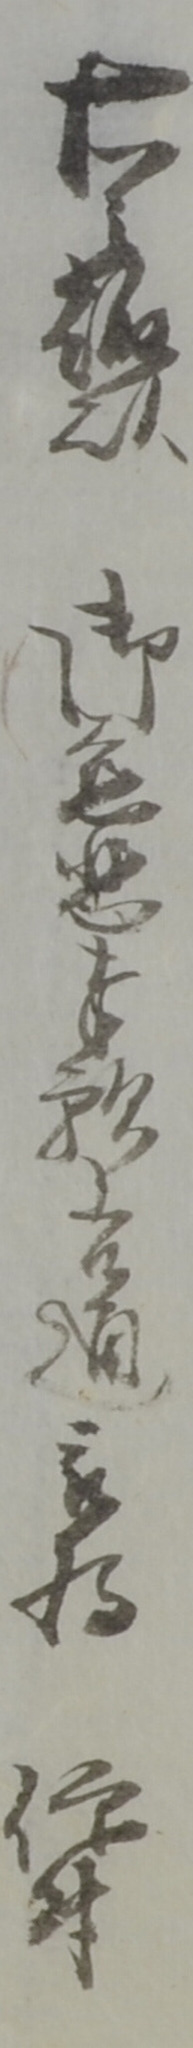右之趣以御慈悲奉願上候通被為仰付
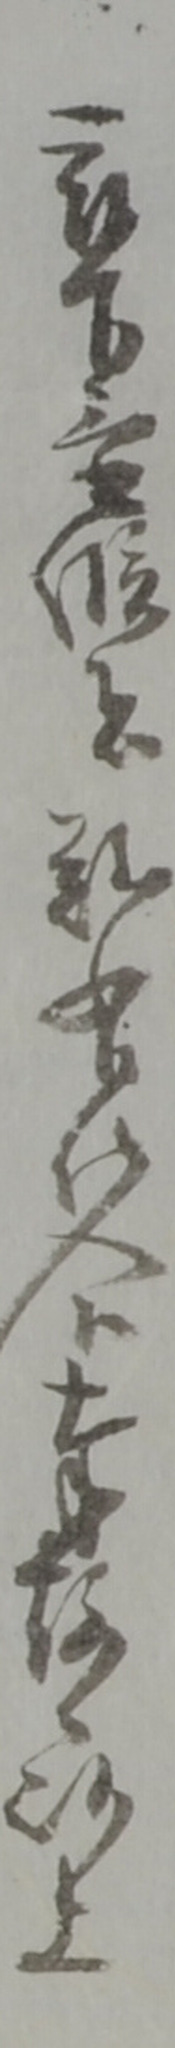被下置候者難有仕合奉存候以上
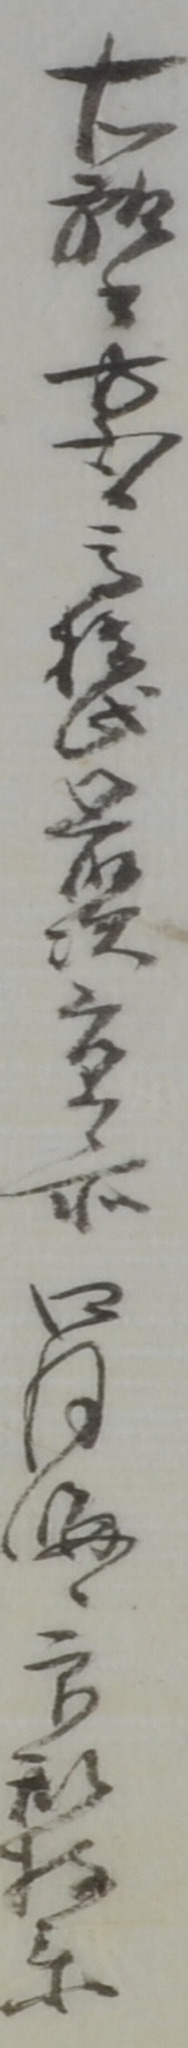右願書廿五日高橋氏御取次差上候所四月晦日印形持参
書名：諸願書控簿
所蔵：伊那市立高遠町図書館・合同会社AMANE
